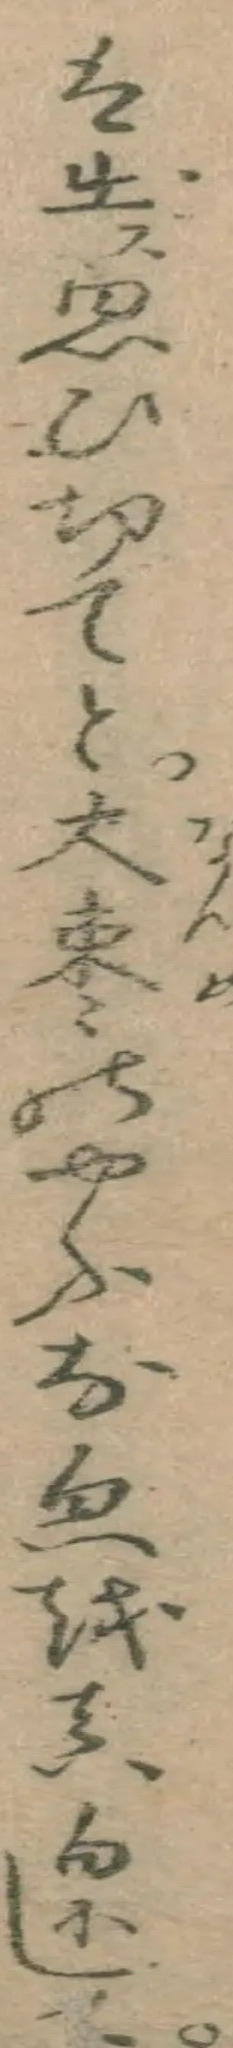は出思ひ切てと。大棗のやふな皃を真白にして。
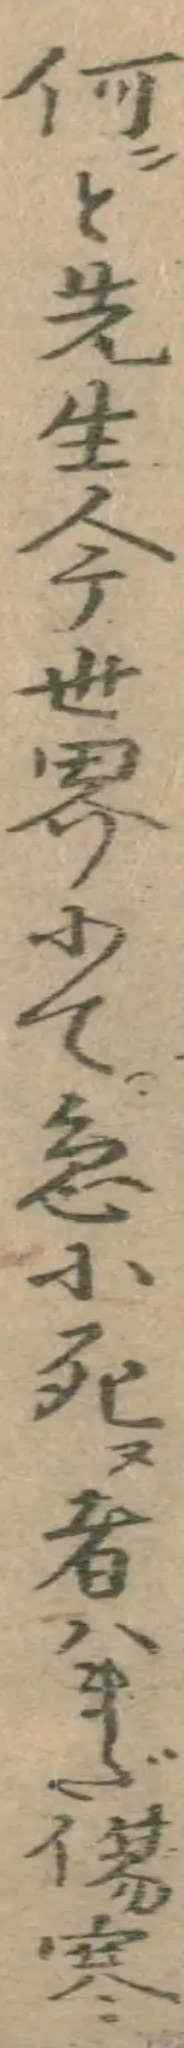何先生今世界にて。急に死者は。まだ傷寒
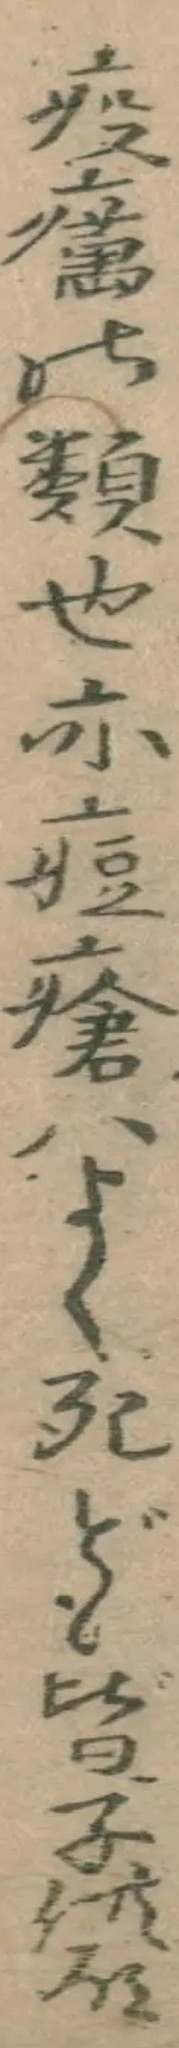疫癘の類也。亦痘瘡はよく死ども皆子供故。
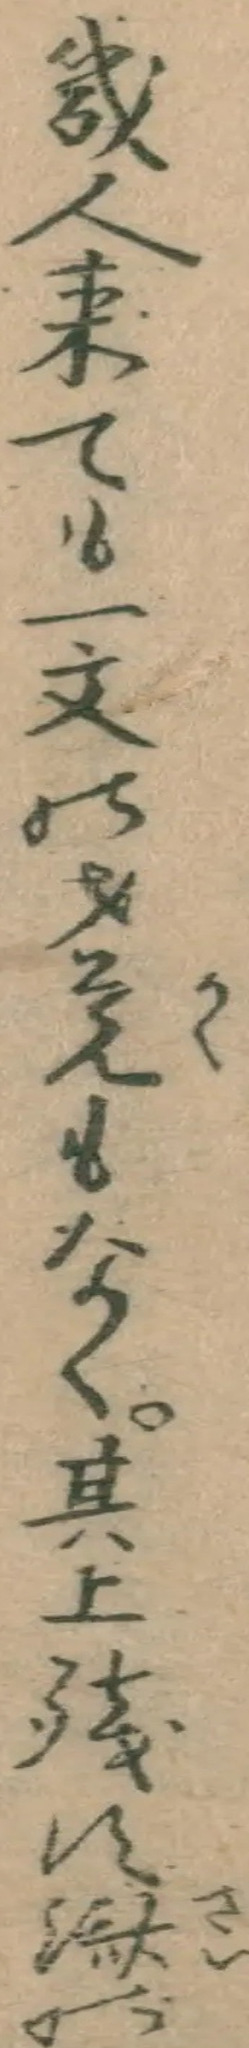幾人来ても一文の才覚もなく。其上残す済の
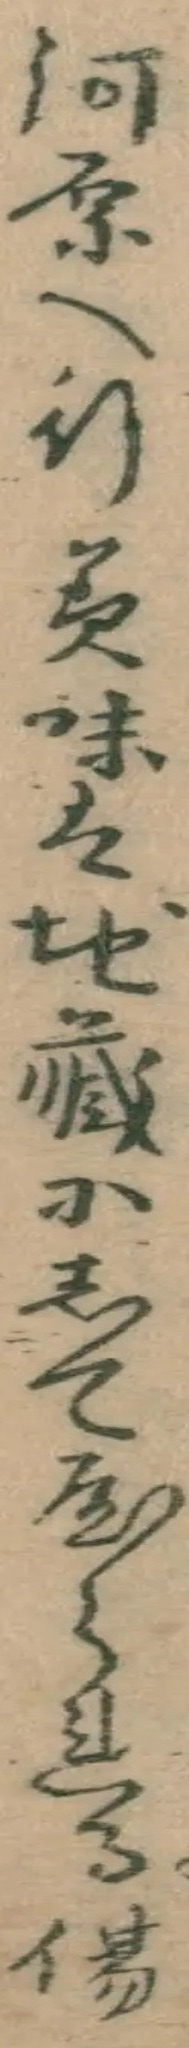河原へ行。美味は地蔵にしてやられる。傷
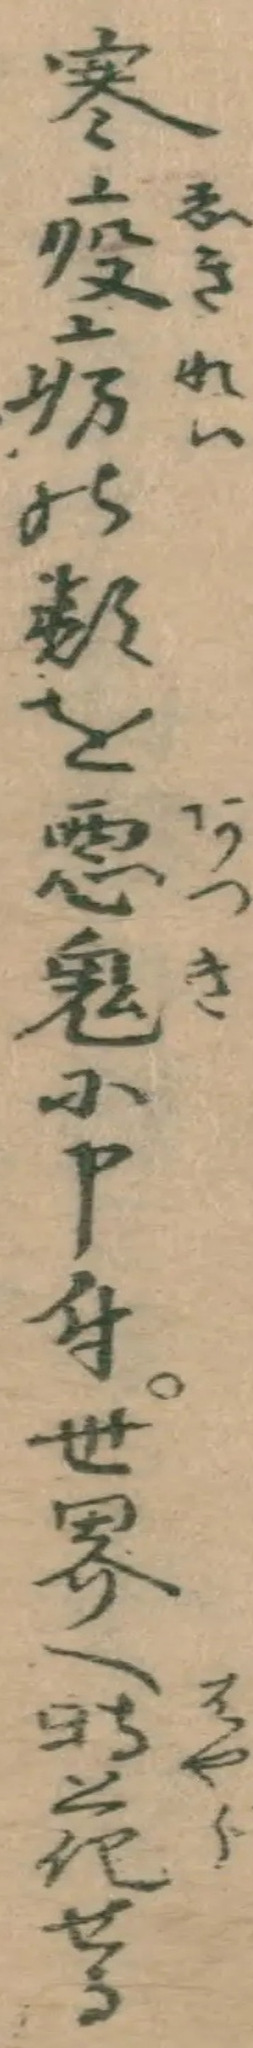寒疫癘の類を悪鬼に申付。世界へ時花せる
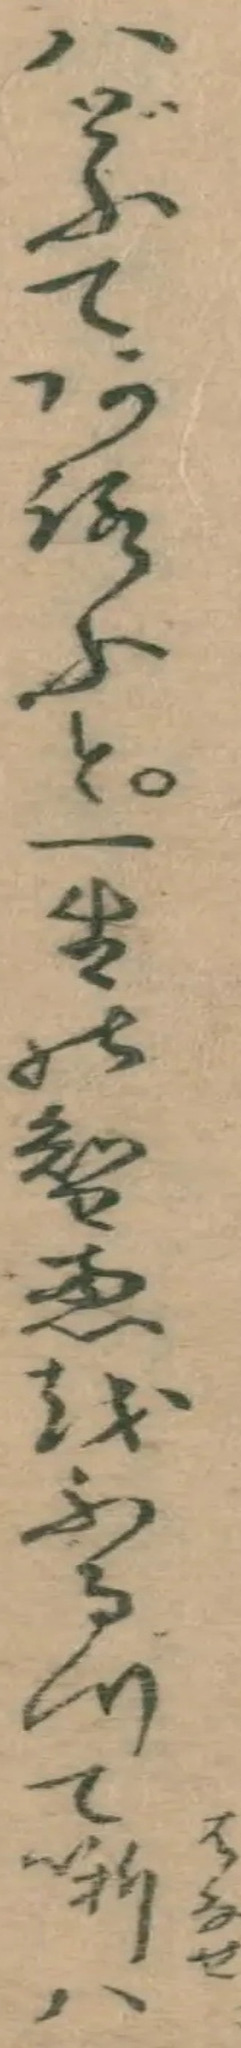はどふてあろふと。一生の智恵をふるつて噺は。
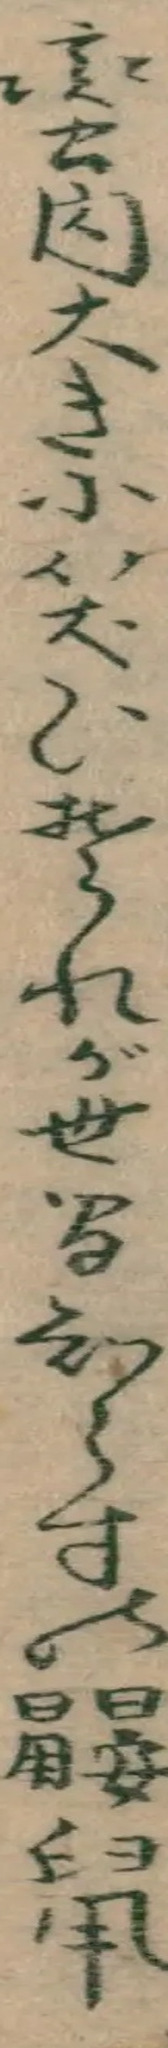蛮内大きに笑ひ。それが世間知らすの鼹鼠。
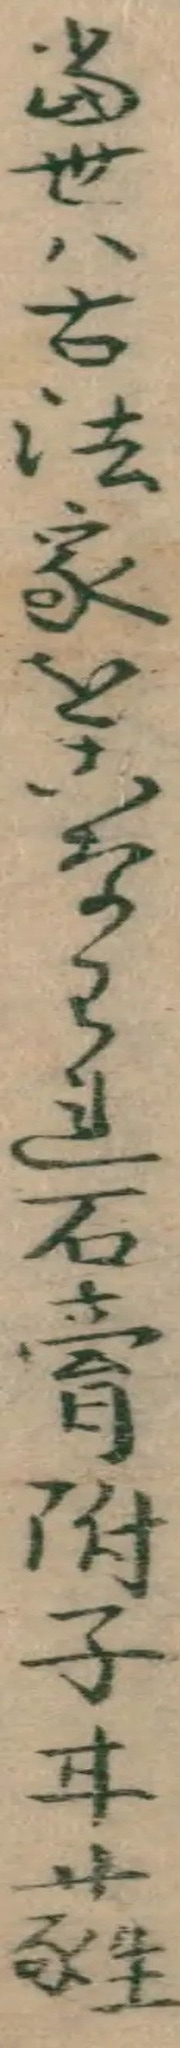当世は古法家をこなわれ。石膏附子甘
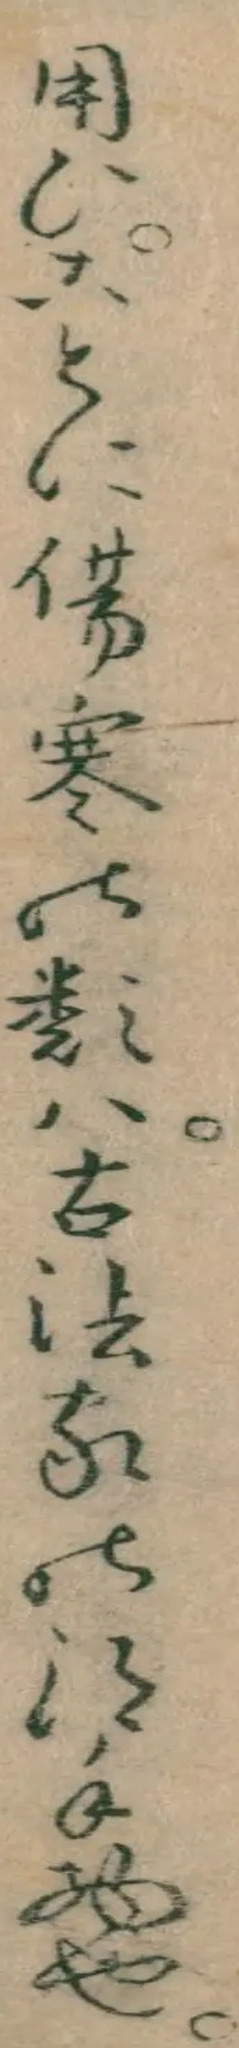用ひ。ことに傷寒の類は。古法家の得手物也。
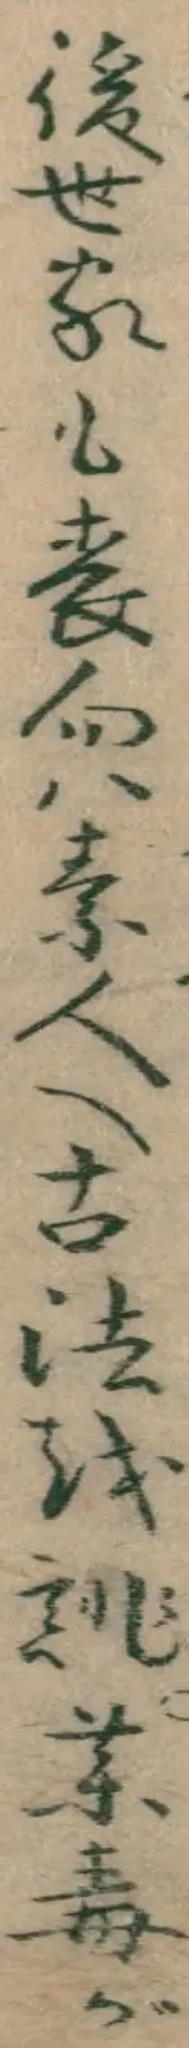後世家も表向は。素人へ古法を誹。薬毒が
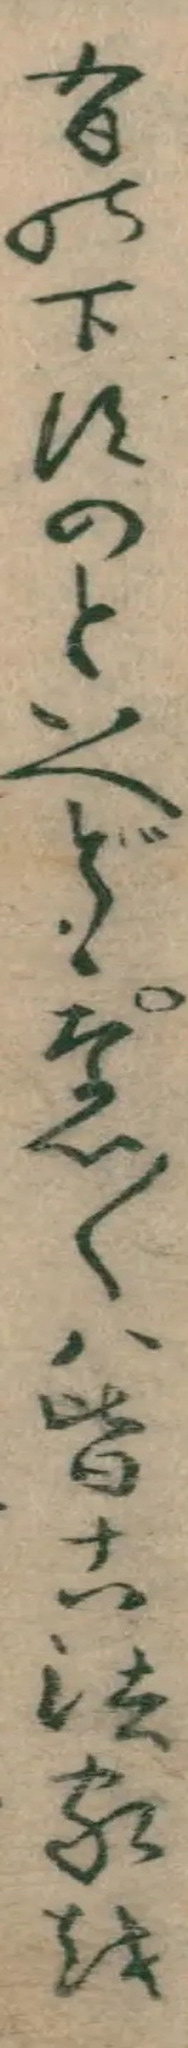有の下すのといへども。ない〳〵は皆古法家を
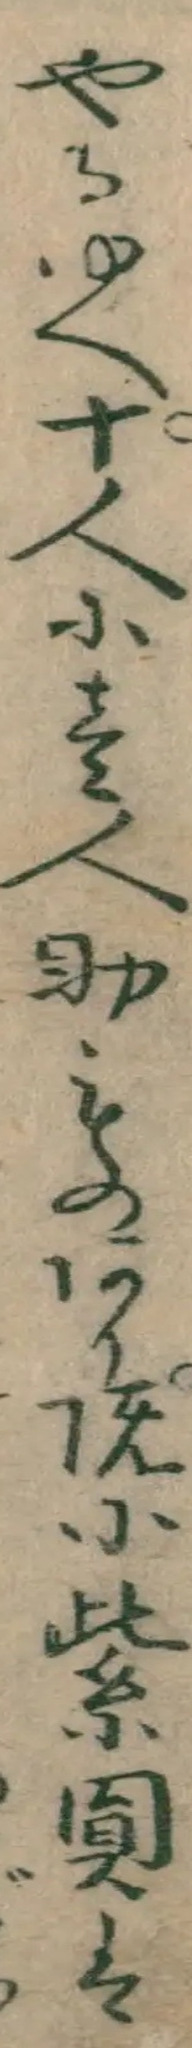やるゆへ。十人に壱人助ものあり。既に紫円は
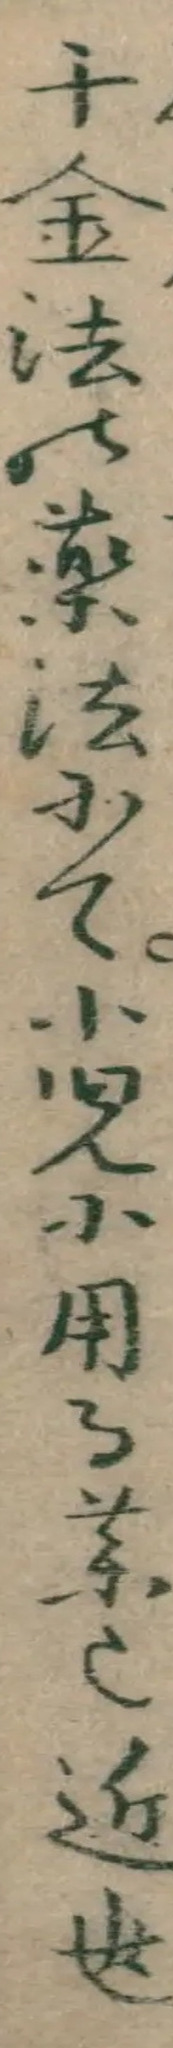千金法の薬法にて。小児に用る薬也。近世

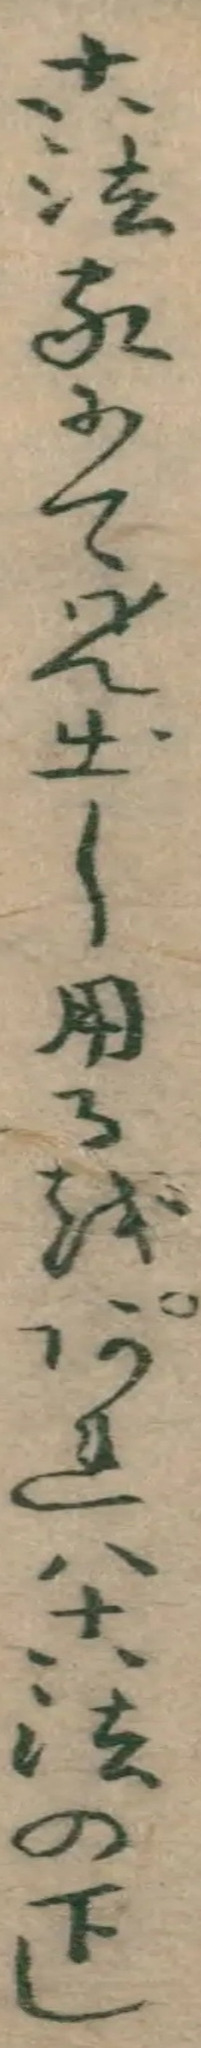古法家にて見出し用るを。あれは古法の下し
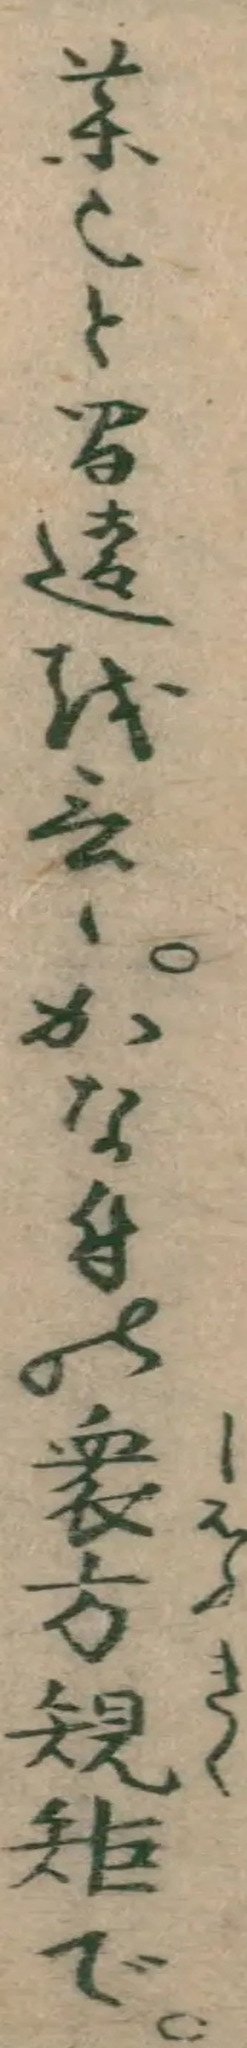薬也と間違を言ゝ。かな付の衆方規矩で。
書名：翻草盲目
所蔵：国立国会図書館 National Diet Library, JAPAN
